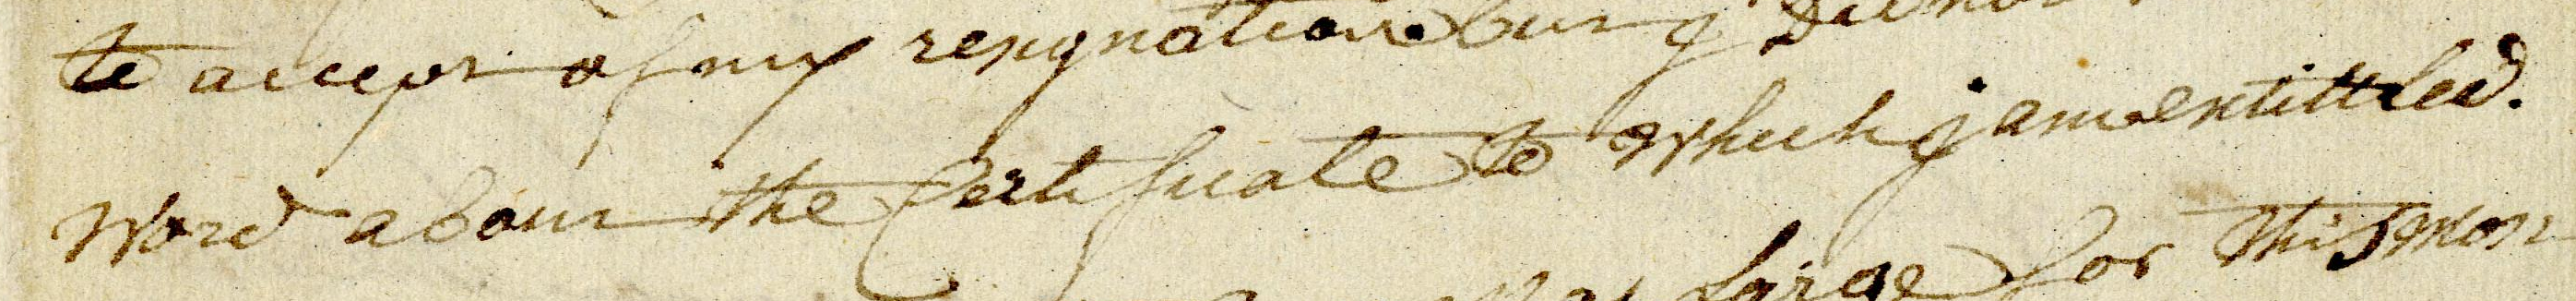word about the Certificate to which I am entitled.
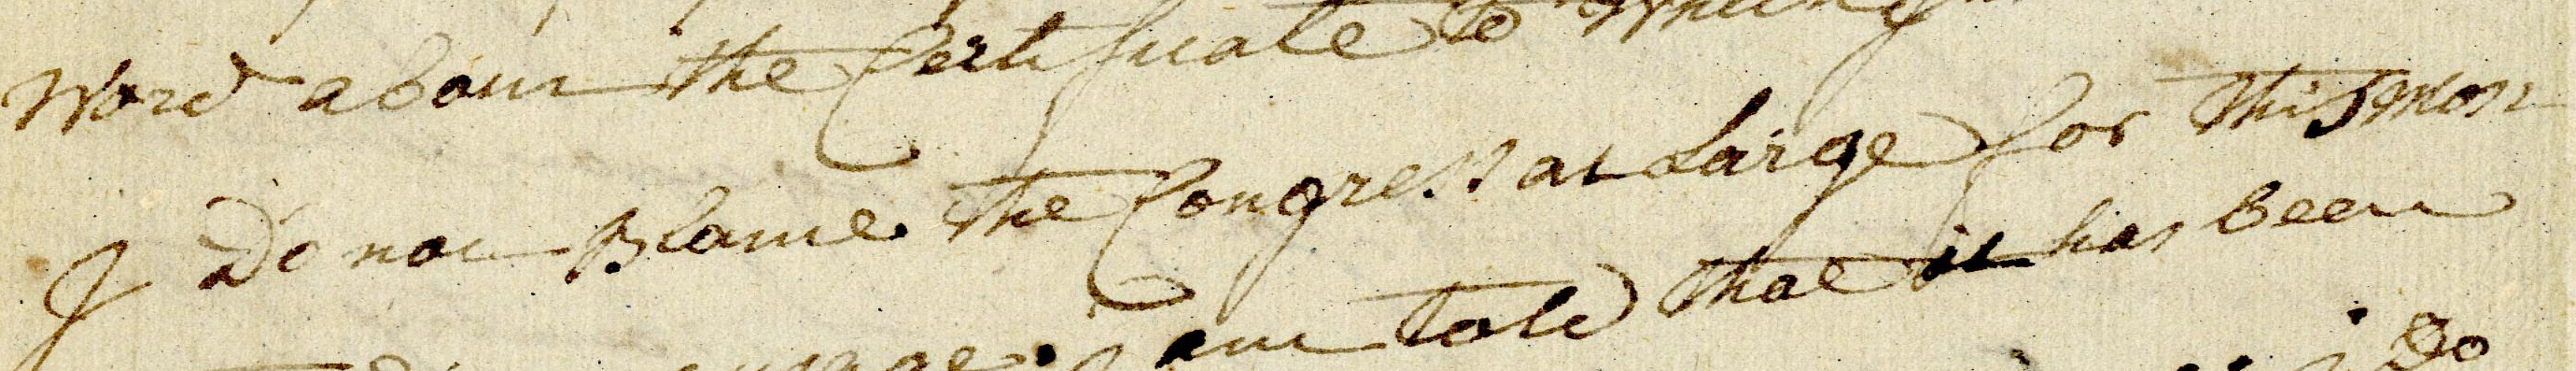I Do not blame the Congress at Large for This Most
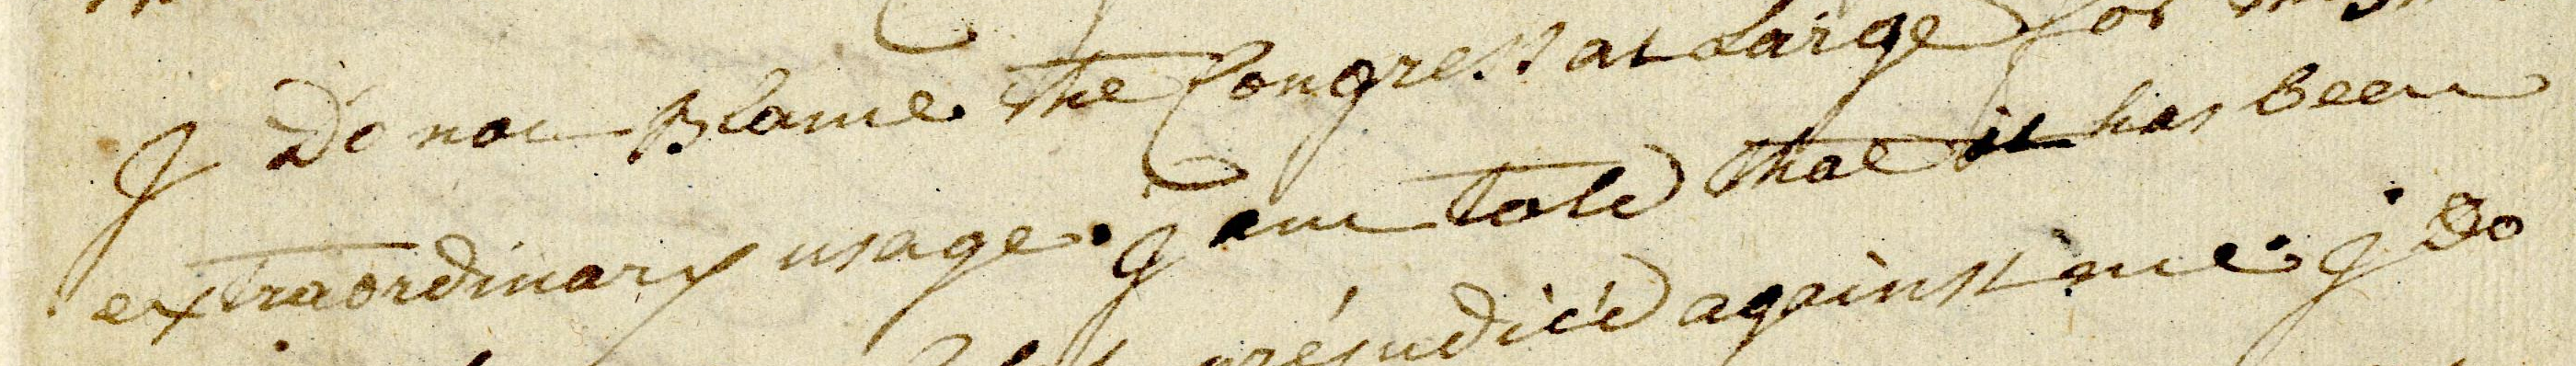extraordinary usage I am told that it has been
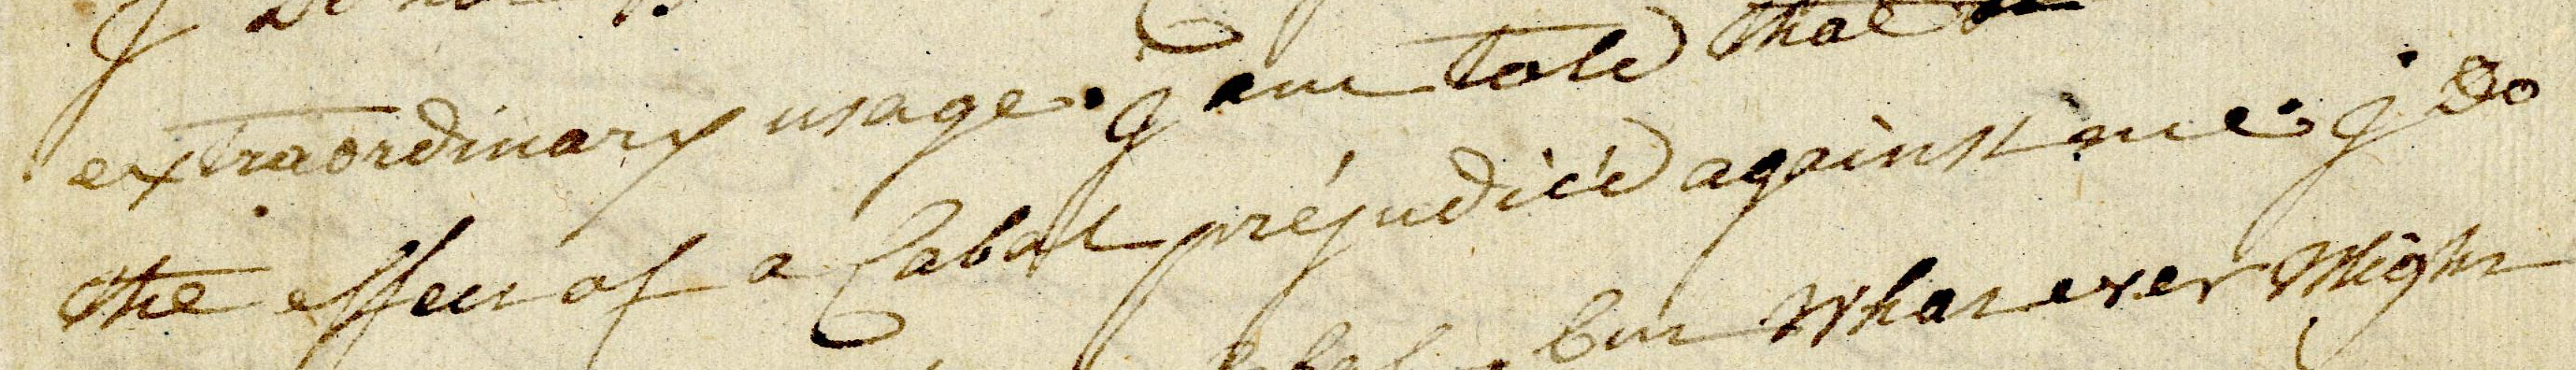the offer of a Cabal prejudice against me I Do
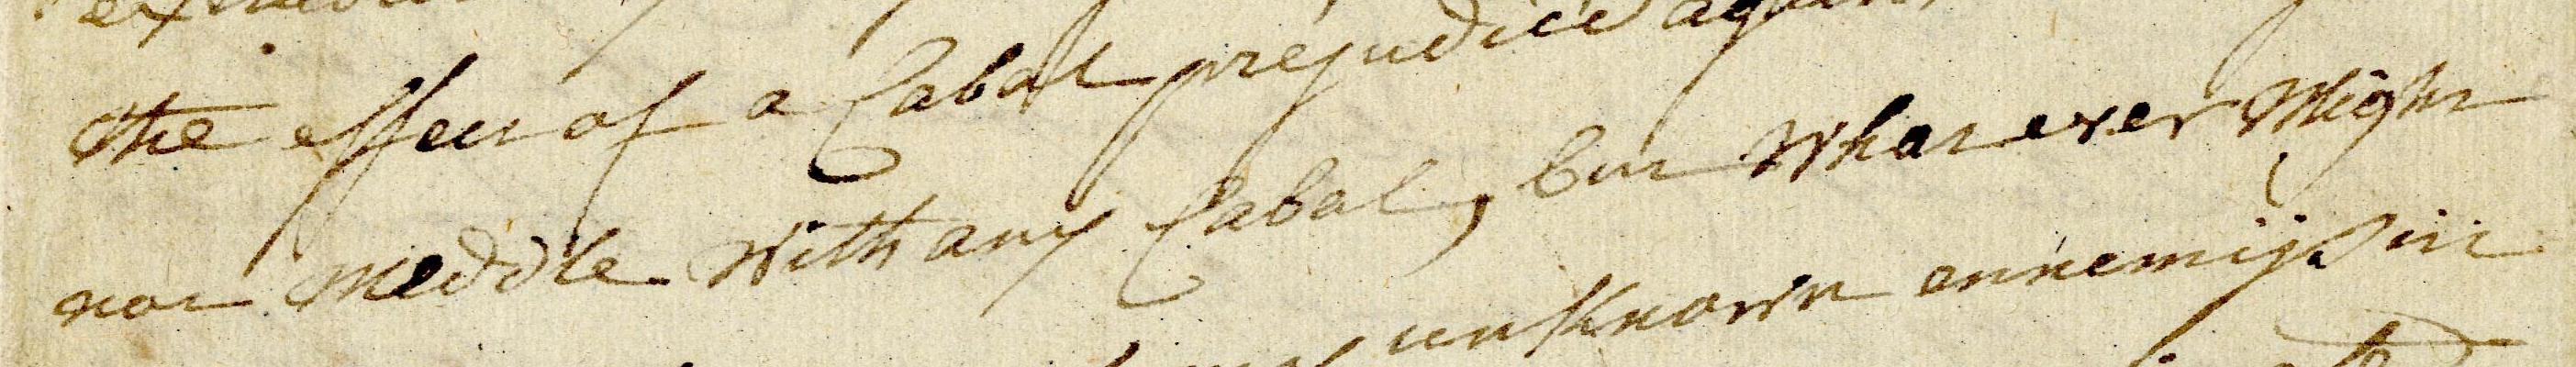not Meddle With any Cabal but what ever might
